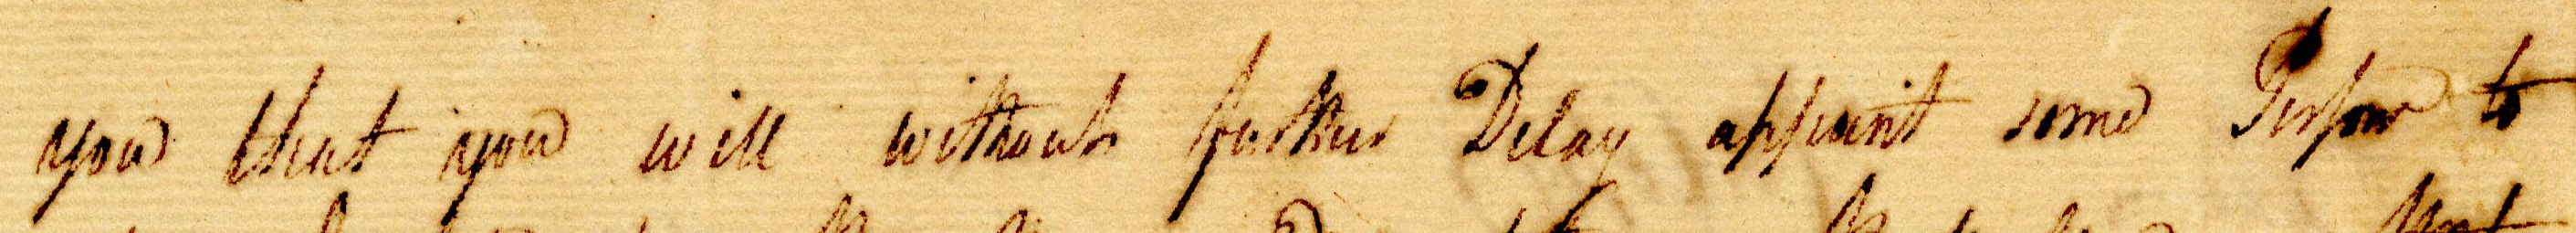you that you will without further Delay appoint some Person to
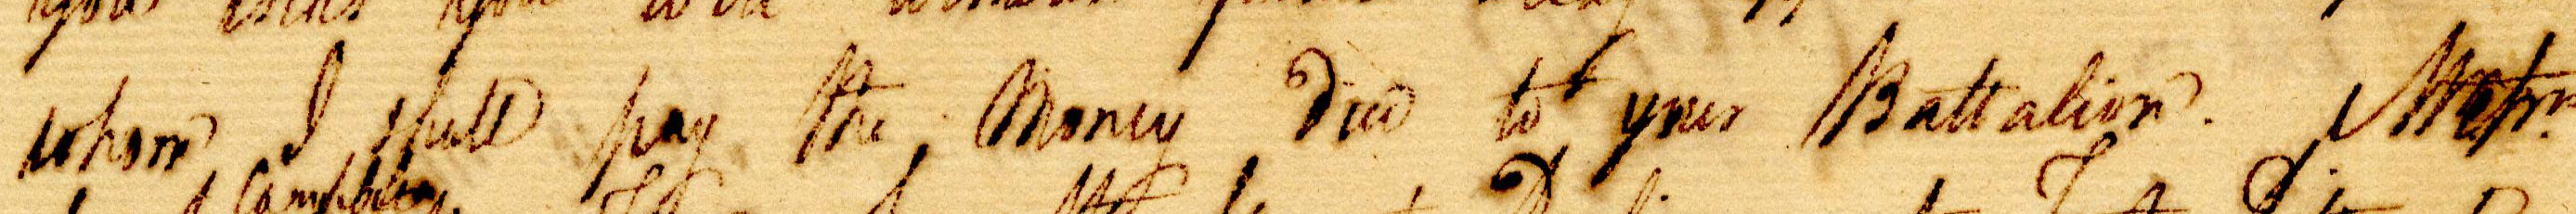whom, I shall pay the Money due to your Battalion. Mess^r.
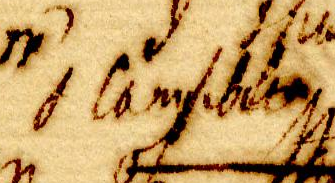of Campbell
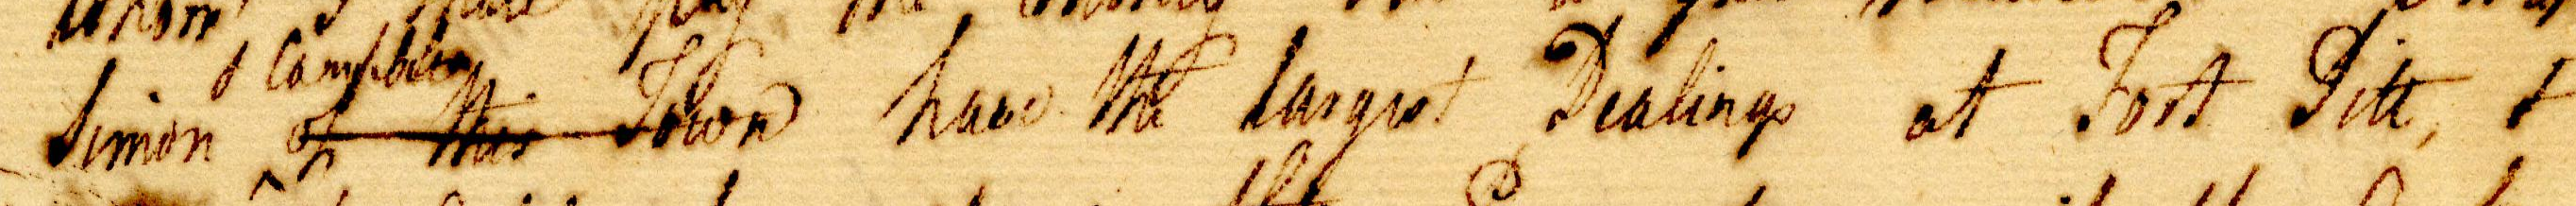Simon ^ of their Town have the largest Dealing at Fort Pitt, &
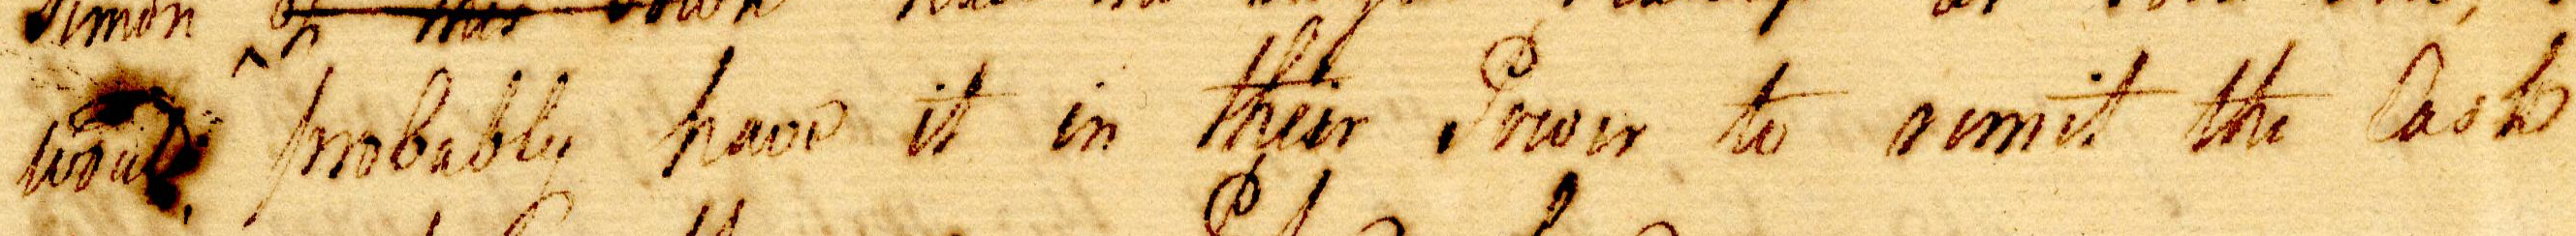would probably have it in their Power to remit the Cash
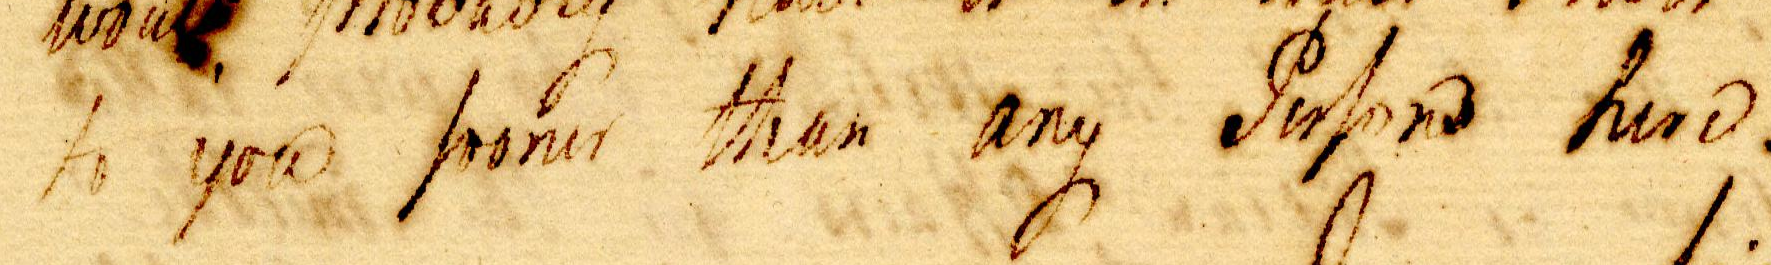to you sooner than any Person here.
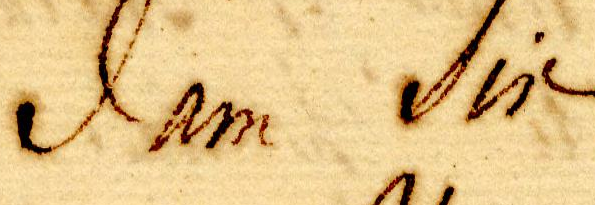I am Sir
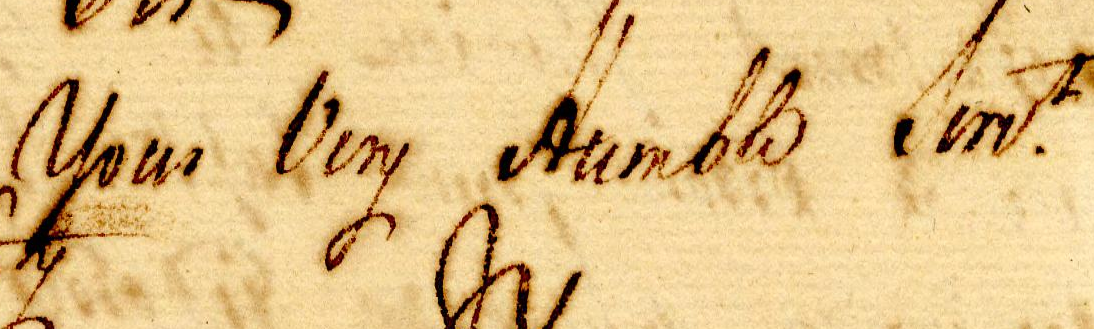Your Very Humble Serv^t.
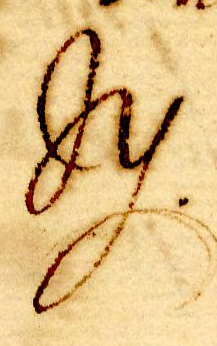JY
